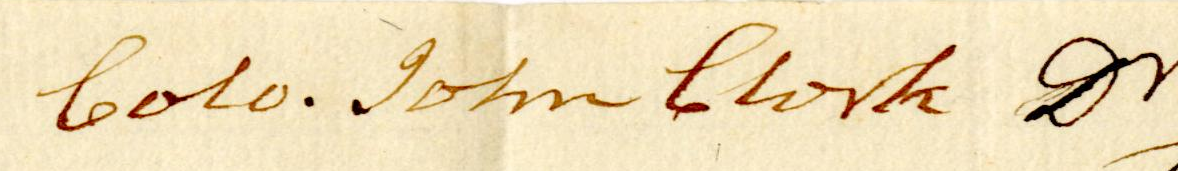Colo. John Clark D^r
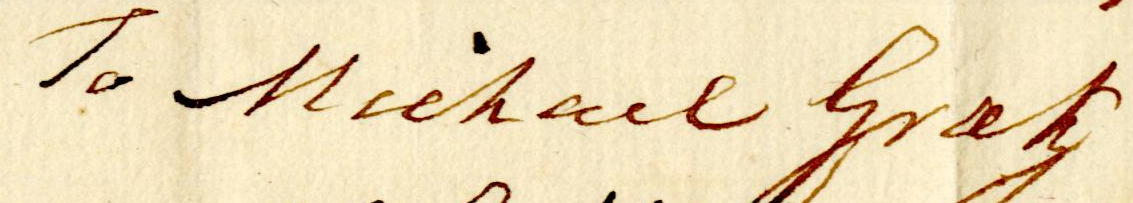To Michael Gratz
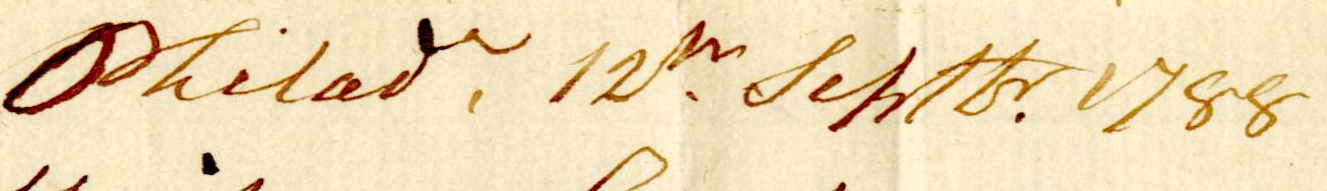Philad^a 12^th Sept^br. 1788
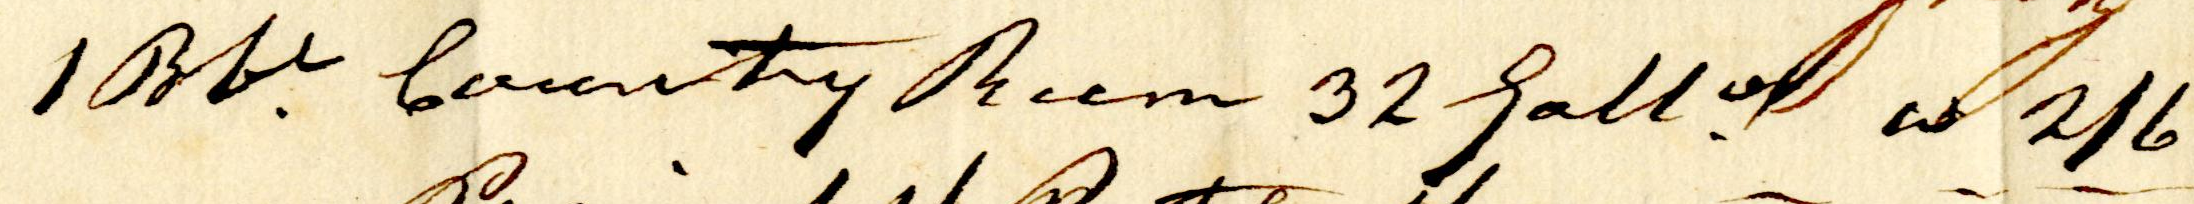1 Bt^l County Rum 32 gall^n @ 2s6
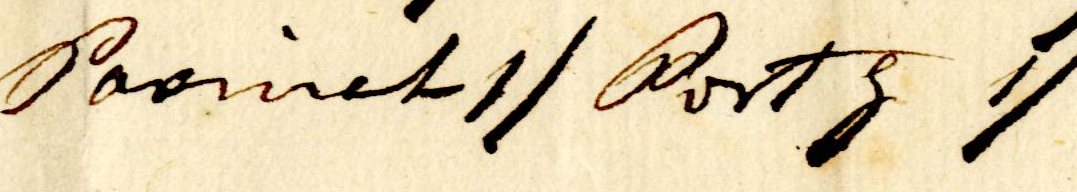Posinet 1s Port g 1s
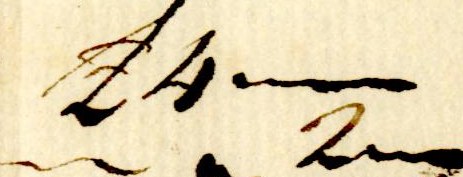£4-
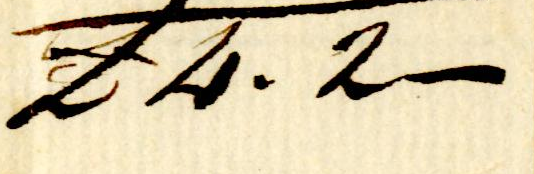£4.2
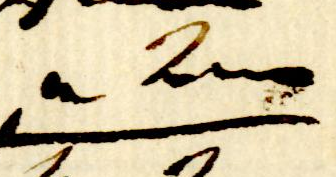2s
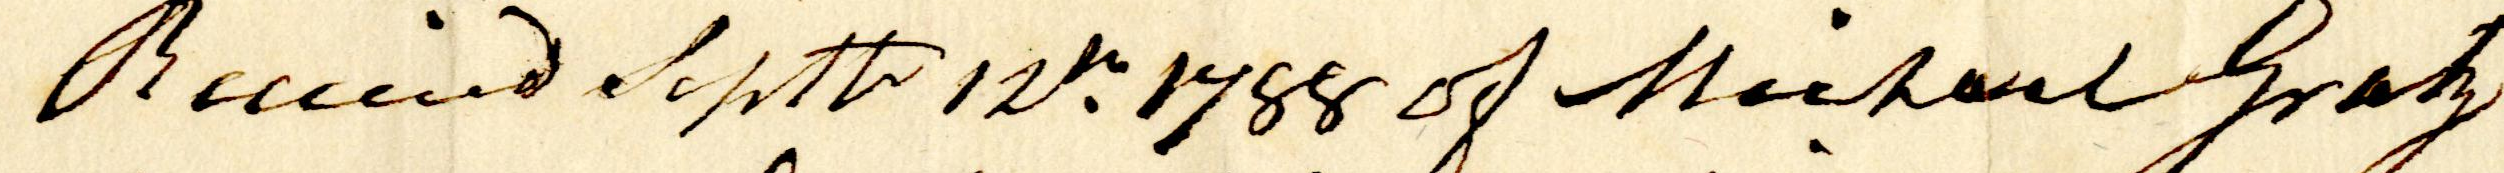Received Sept^r 12^th 1788 of Michael Gratz
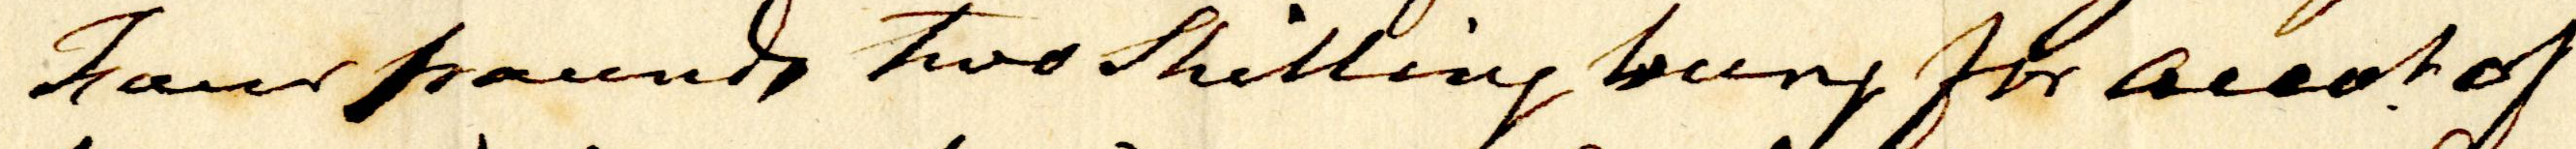Four Pounds, two shillings being for acco^t of
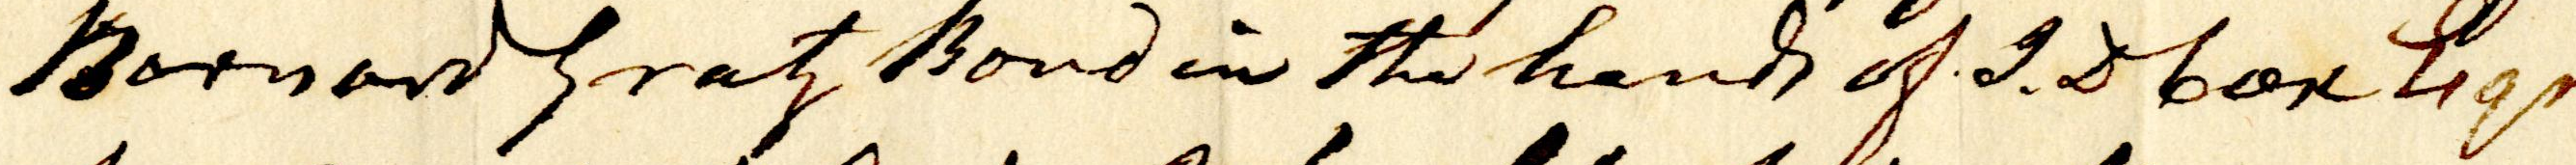Barnard Gratz Bond in the hands of J. D Cox Esq^r
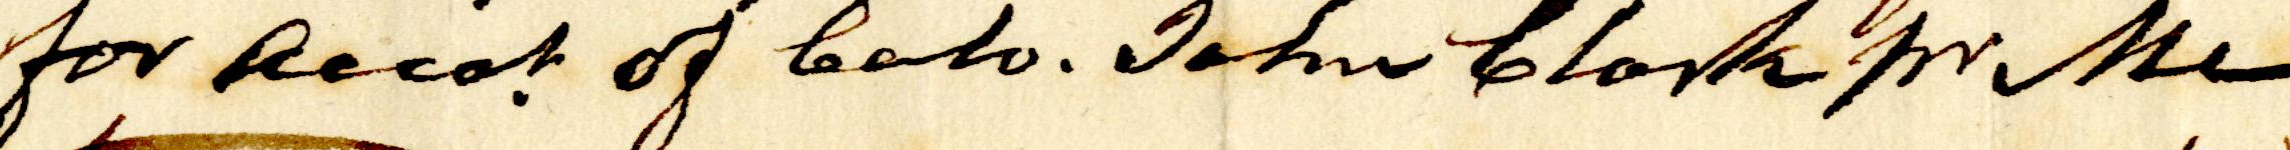for acco^t of Colo. John Clark per Me
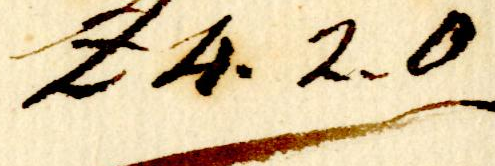£4.2.0
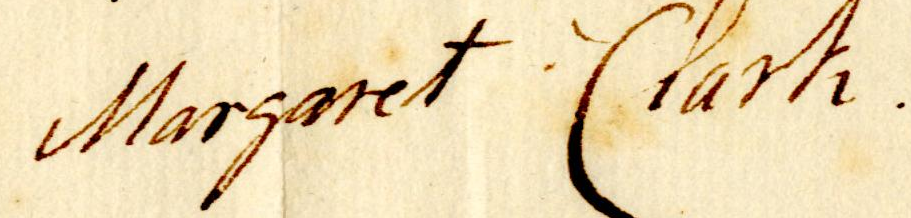Margaret Clark
